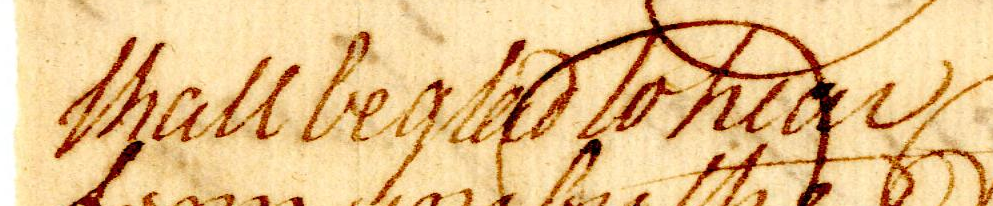Shall be glad to hear
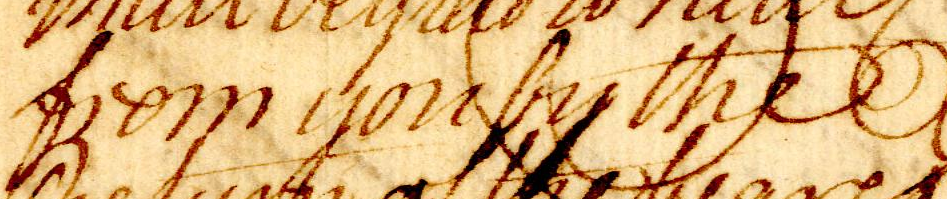from you by the
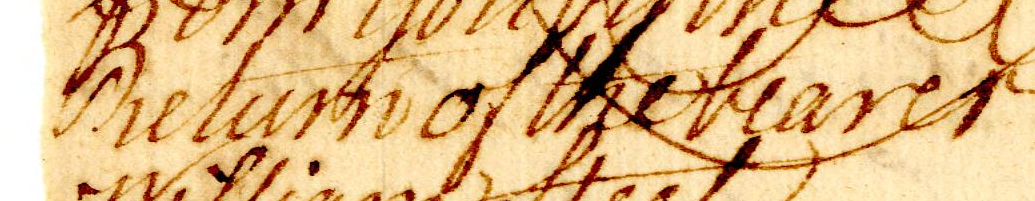Return of the bearer
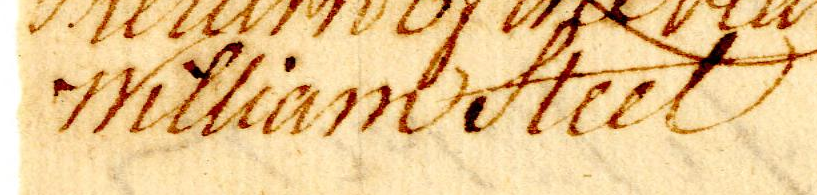William Steel
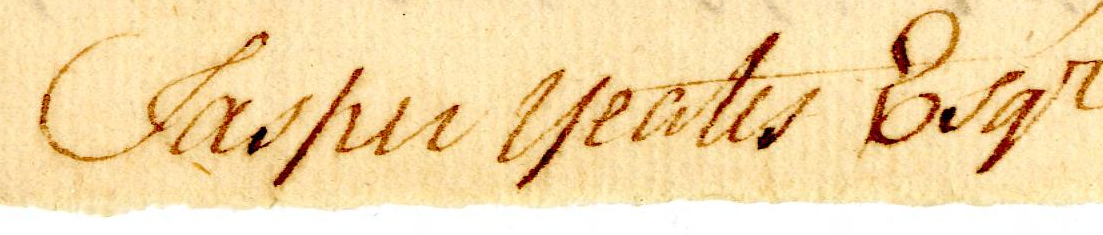Jasper Yeates Esq^r
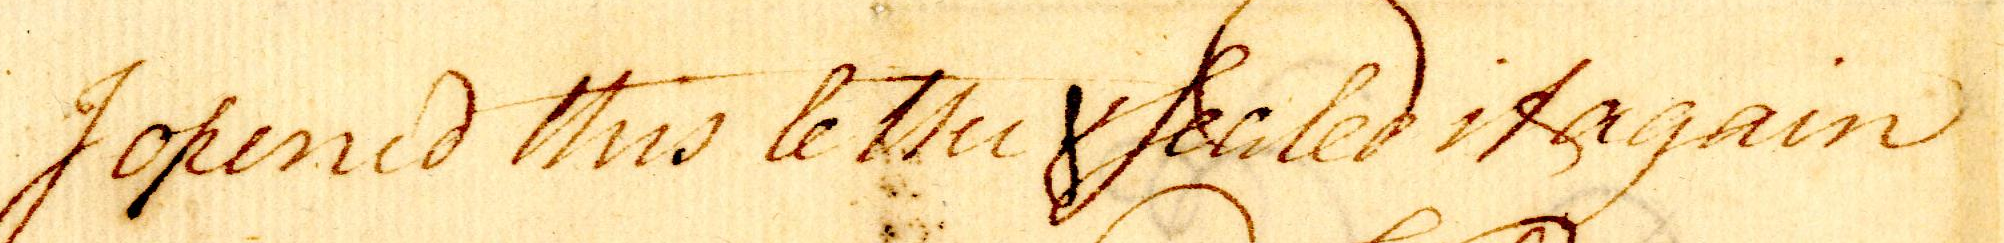I opened this letter & Sealed it again
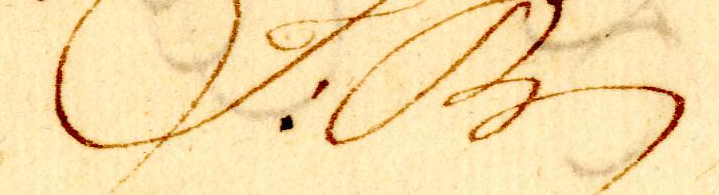J: B
